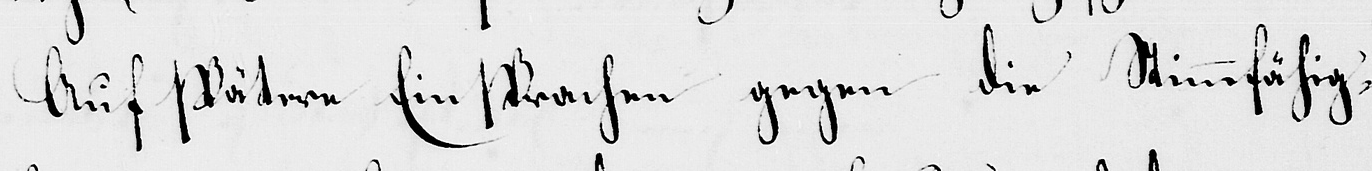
Auf spätere Einsprachen gegen die Stimmfähig¬
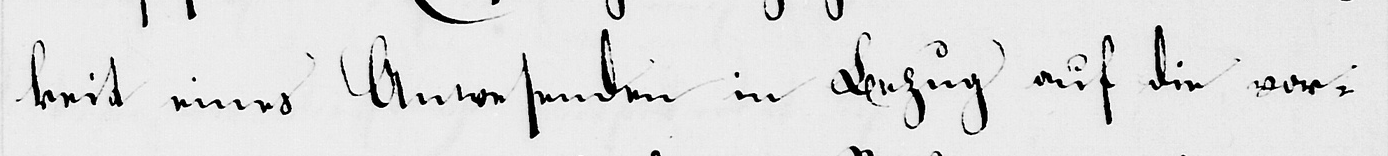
keit eines Anwesenden in Bezug auf die vor¬
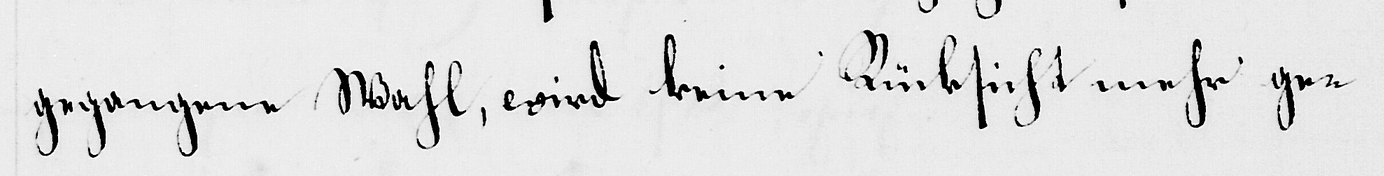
gegangene Wahl, wird keine Rücksicht mehr gen¬
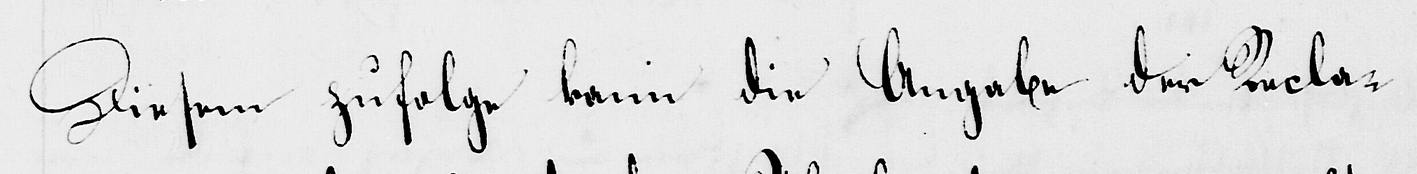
Diesem zufolge kann die Angabe der Recla¬
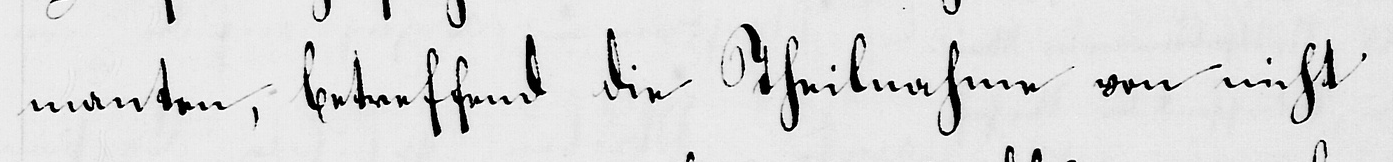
manten, betreffend die Theilnahme von nicht
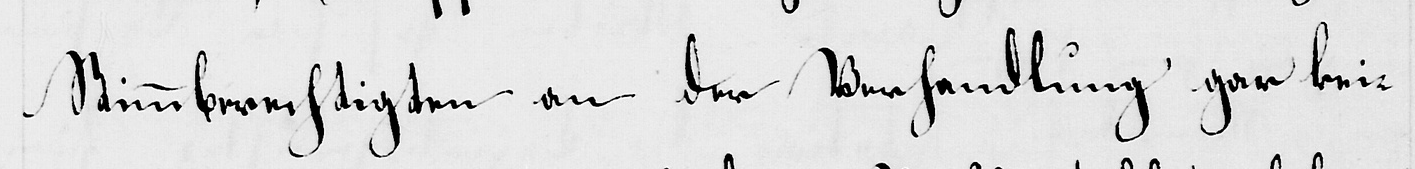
Stimmberechtigten an der Verhandlung gar kei¬
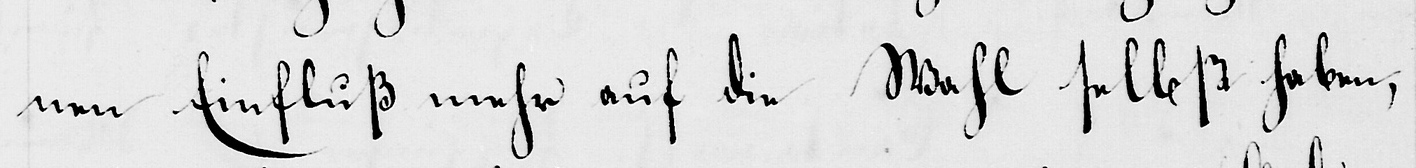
nen Einfluß mehr auf die Wahl selbst haben,
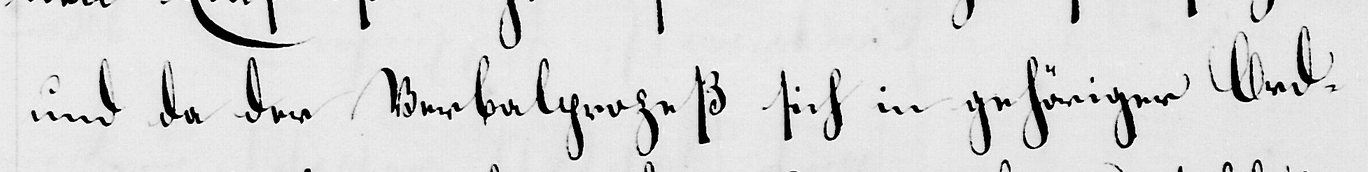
und da der Verbalprozeß sich in gehöriger Ord¬
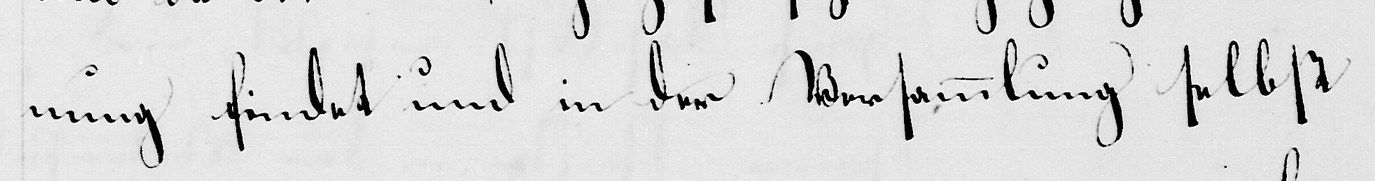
nung findet und in der Versammlung selbst
